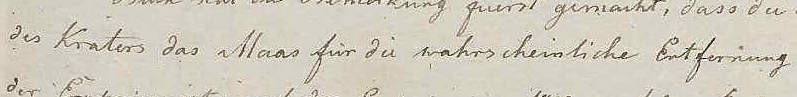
des Kraters das Maas für die wahrscheinliche Entfernung
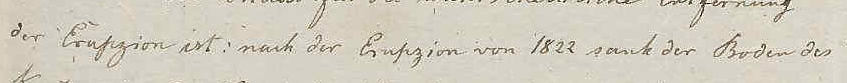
der Erupzion ist: nach der Erupzion von 1822 sank der Boden des
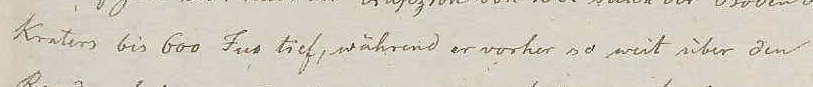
Kraters bis 600 Fus tief, während er vorher so weit über den
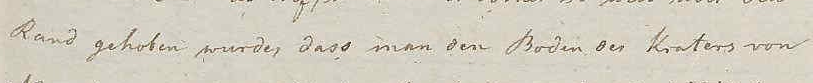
Rand gehoben wurde, dass man den Boden des Kraters von
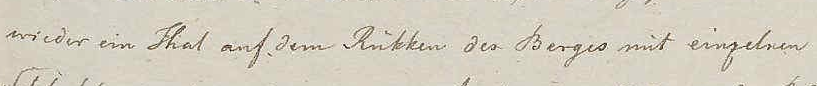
wieder ein Thal auf dem Rükken des Berges mit einzelnen
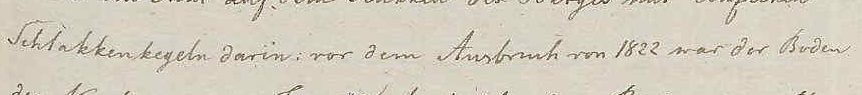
Schlakkenkegeln darin: vor dem Ausbruch von 1822 war der Boden
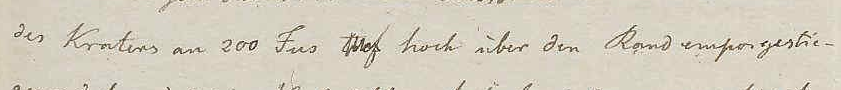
des Kraters an 200 Fus tiefhoch über den Rand emporgestie-
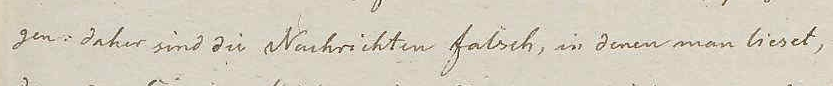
gen: daher sind die Nachrichten falsch, in denen man lieset,
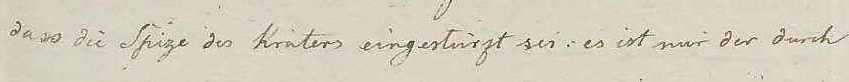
dass die Spize des Kraters eingestürzt sei: es ist nur der
